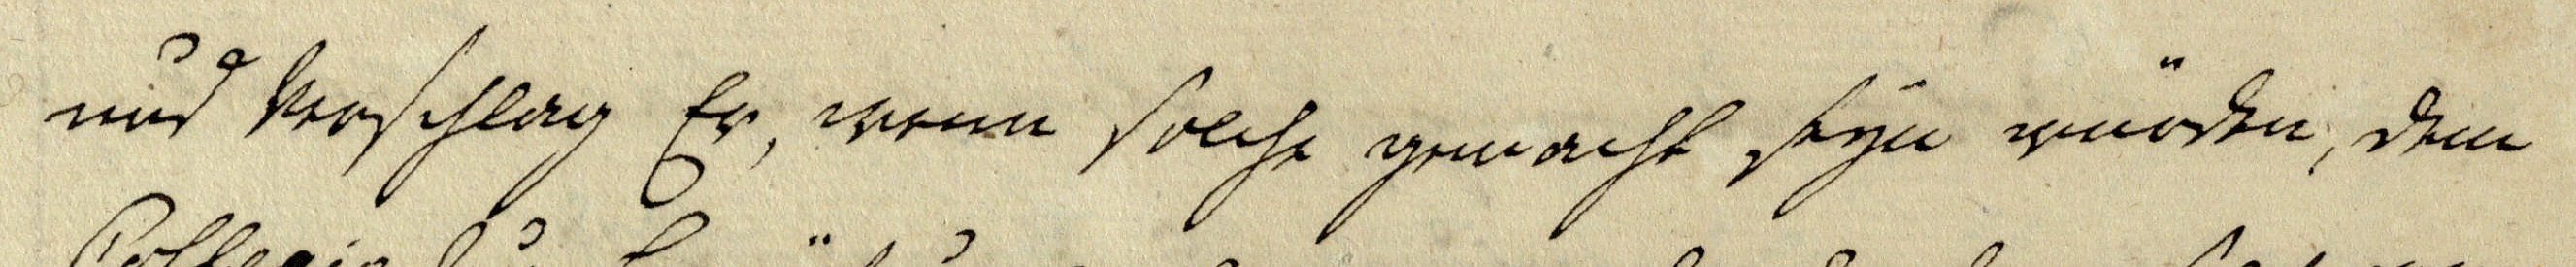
und Verschlag Er, wenn solche gemacht seÿn würden, dem
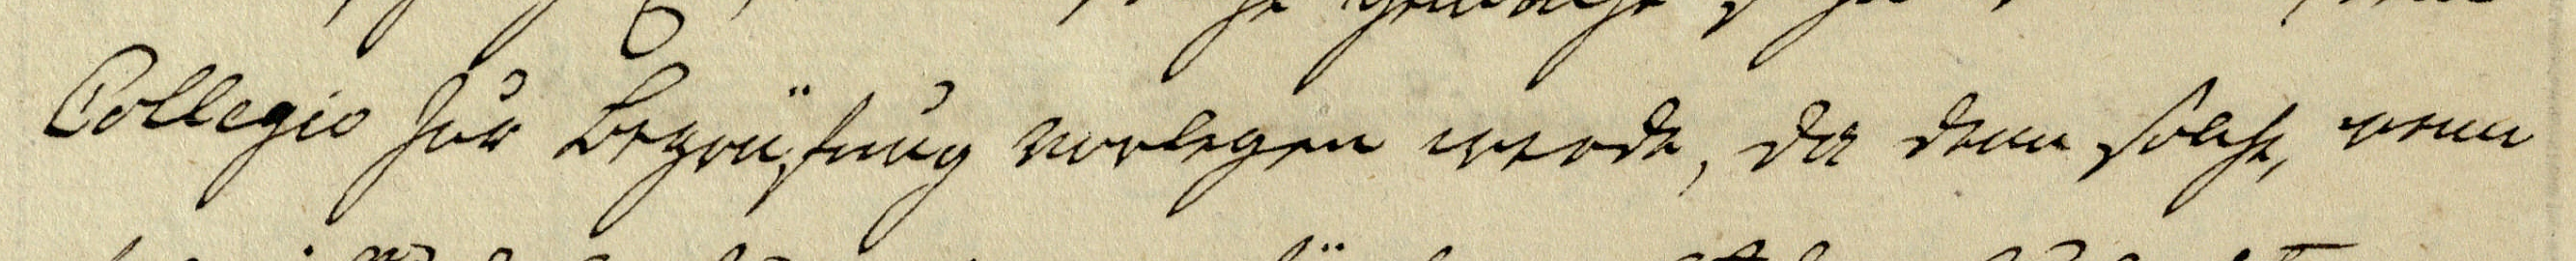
Collegio zur Beprüfung vorlegen werde, da dem solche, wenn
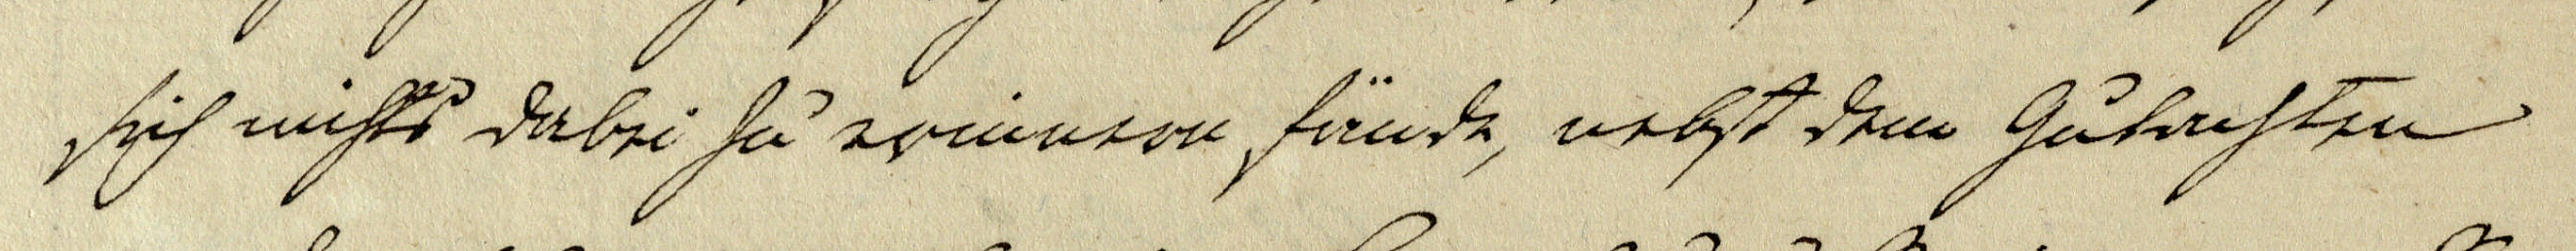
sich nichts dabei zu erinnern fände, nebst dem Gutachten
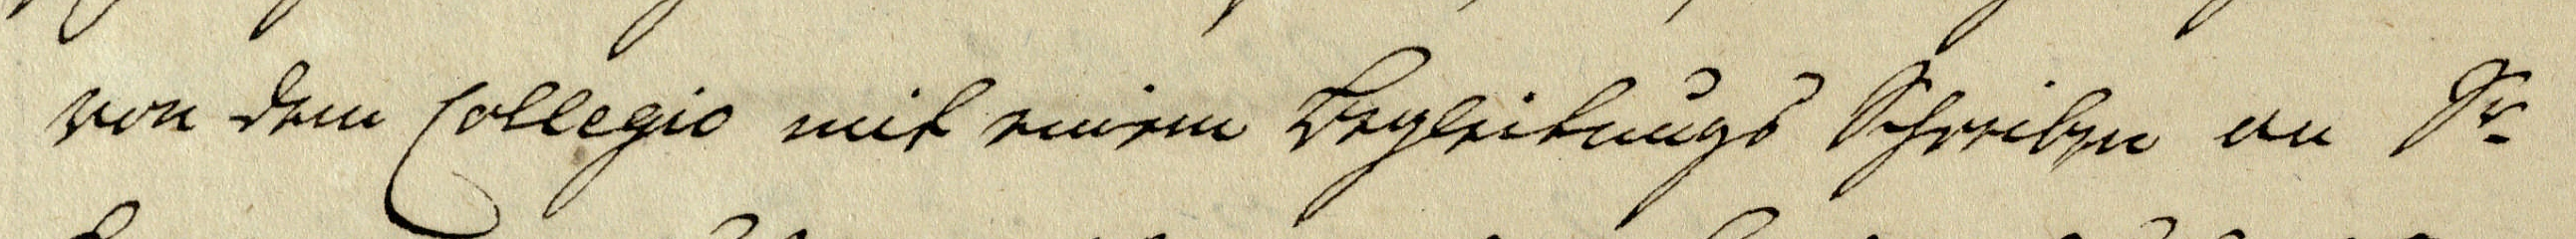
von dem Collegio mit einem Begleitungs Schreiben an Sr
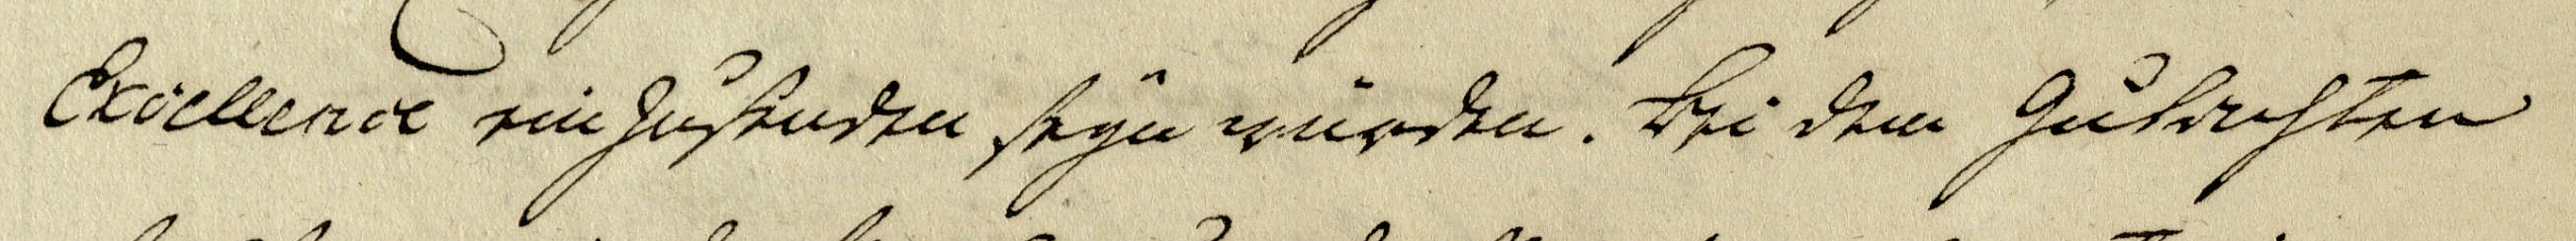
Excellence einzusenden seÿn würden. Bei dem Gutachten
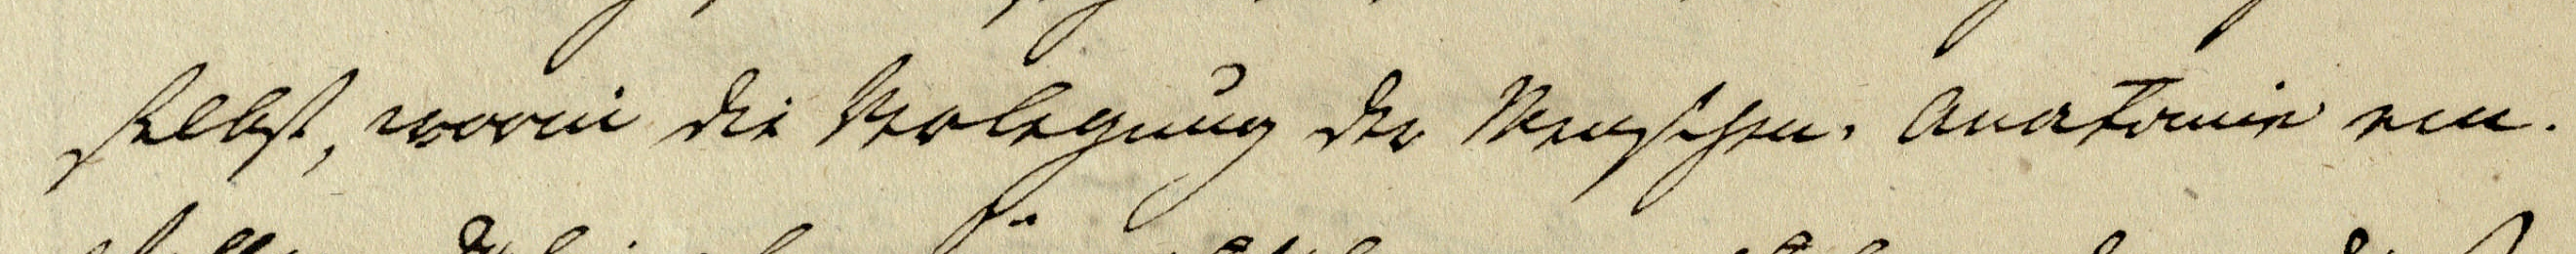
selbst, worin die Verlegung der Menschen. Anatomie em¬
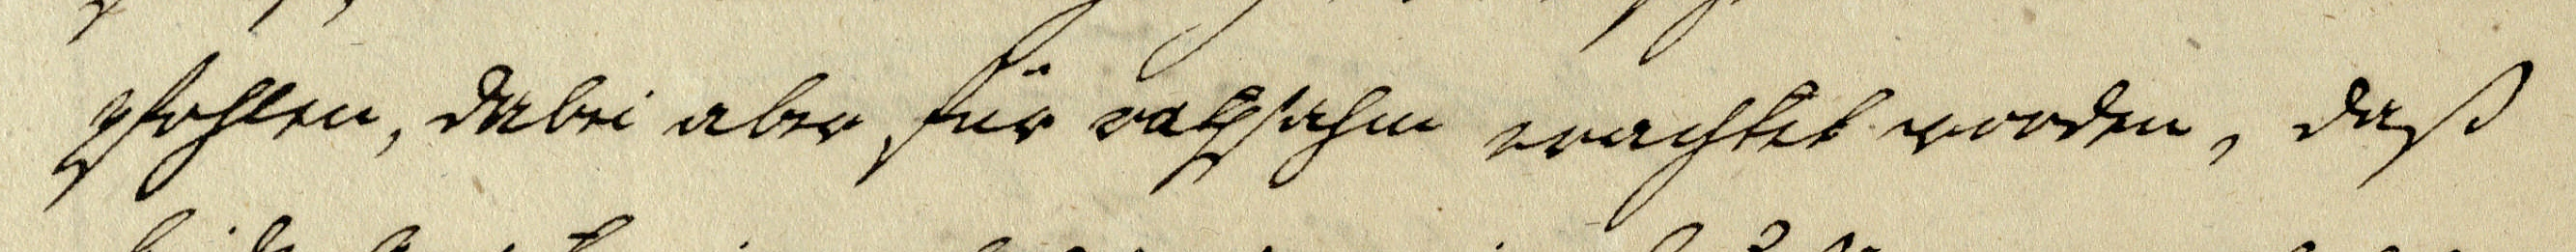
pfohlen, dabei aber für rathsahm erachtet worden, daß
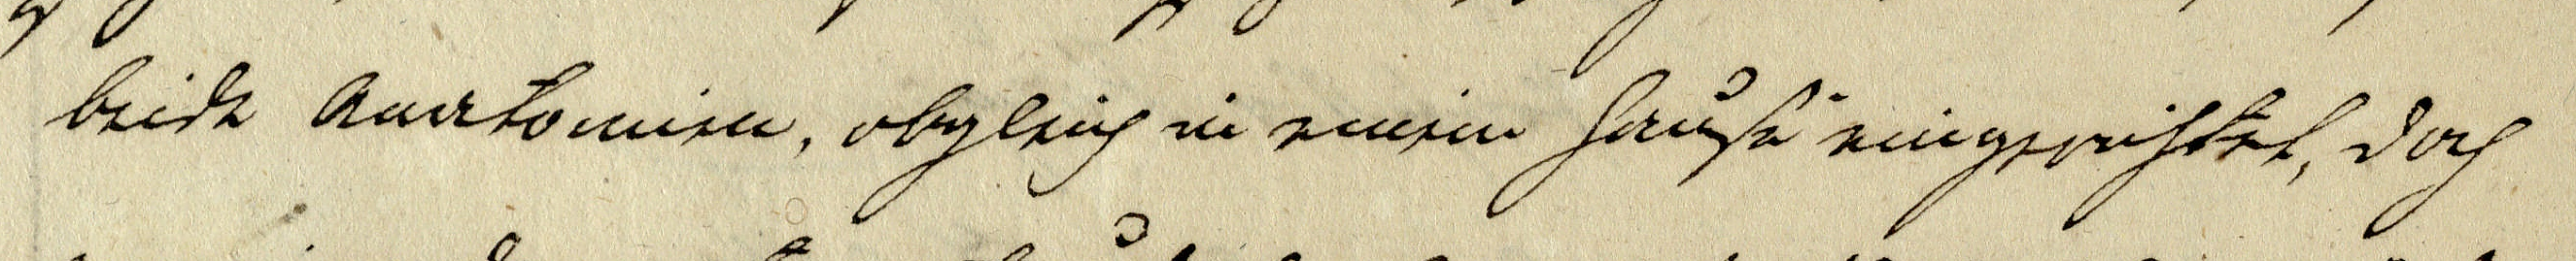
beide Anatomien, obgleich in einem Hause eingerichtet, doch
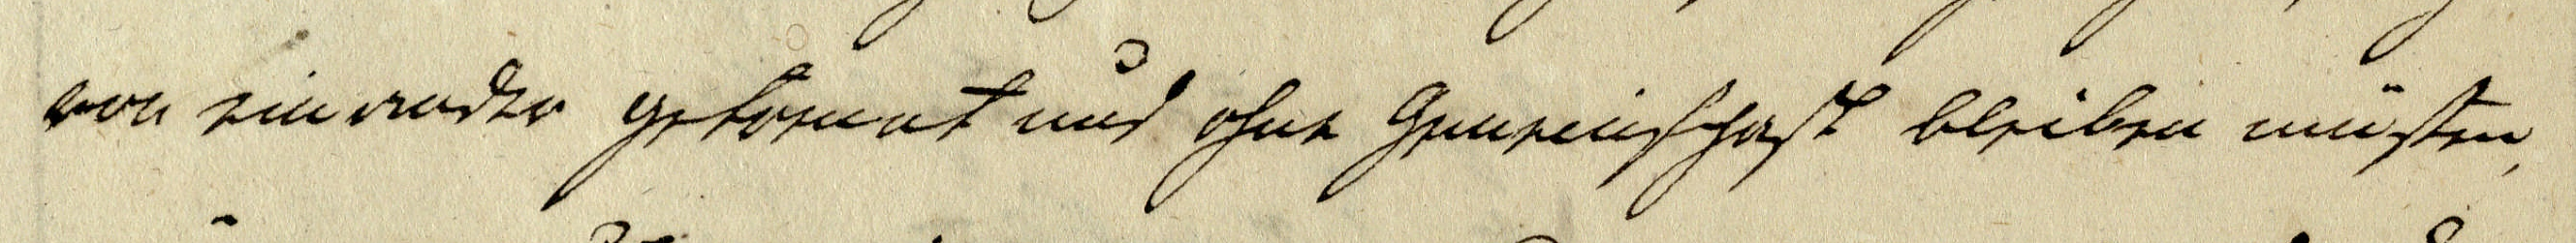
von einander getrennt und ohne Gemeinschaft bleiben müsten,
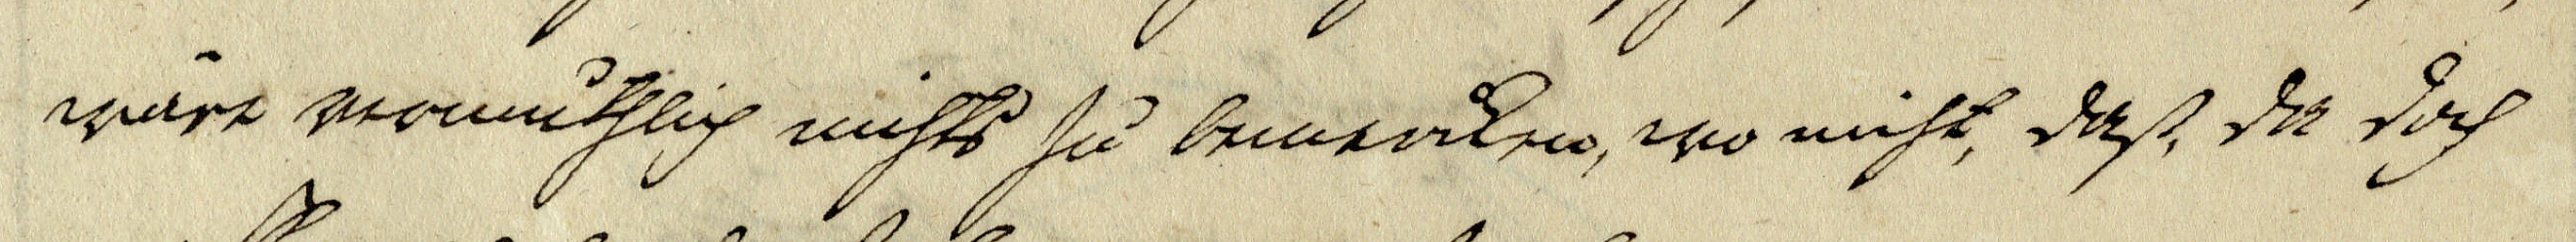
wäre vermuthlich nichts zu bemercken, wo nicht, daß, da doch
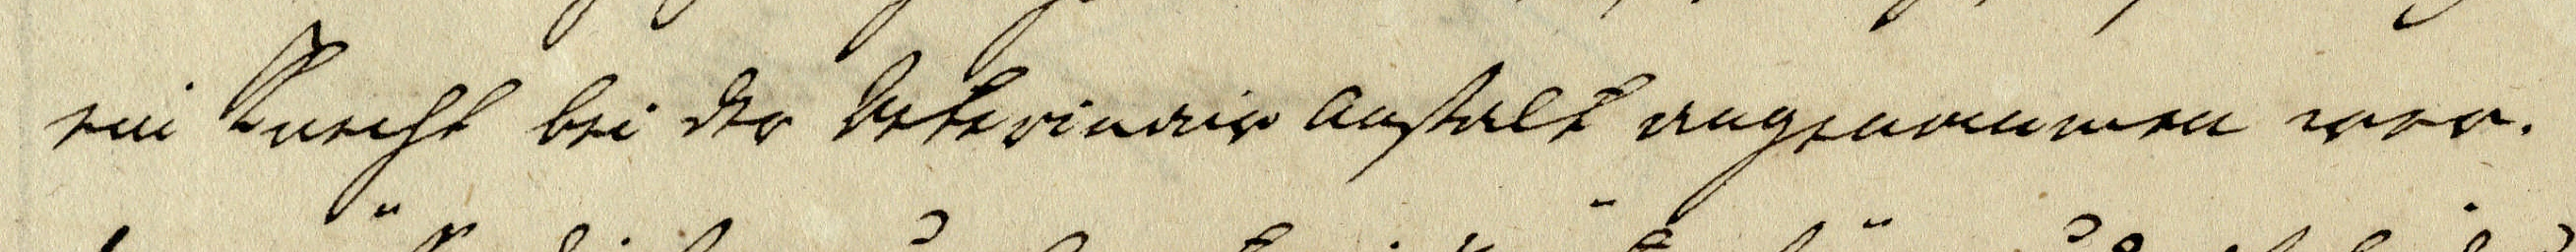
ein Knecht bei der Veterinair Anstalt angenommen wer¬
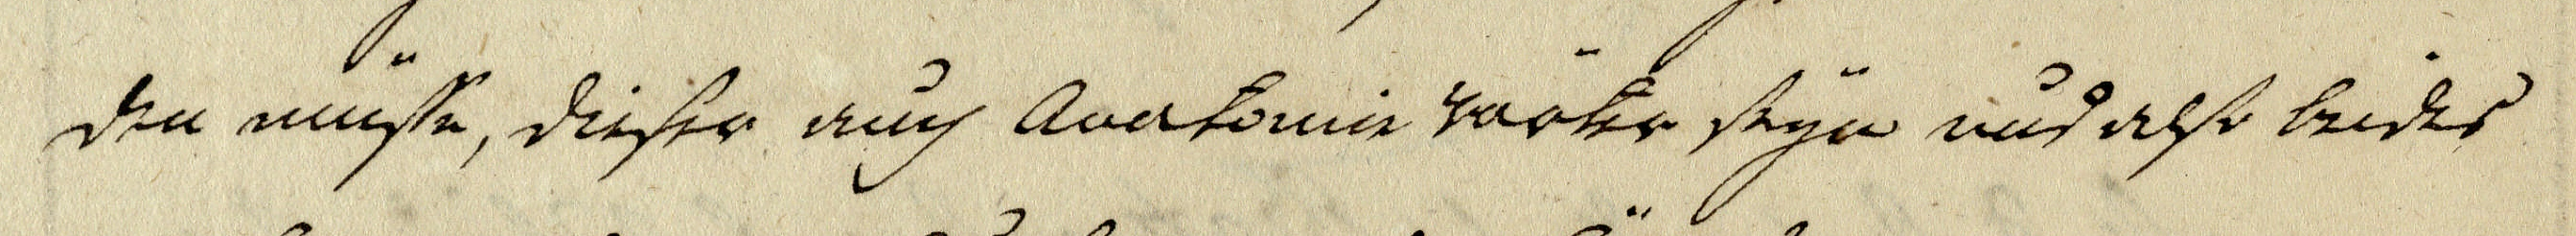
den müsse, dieser auch Anatomie Wärter seÿn und also beides
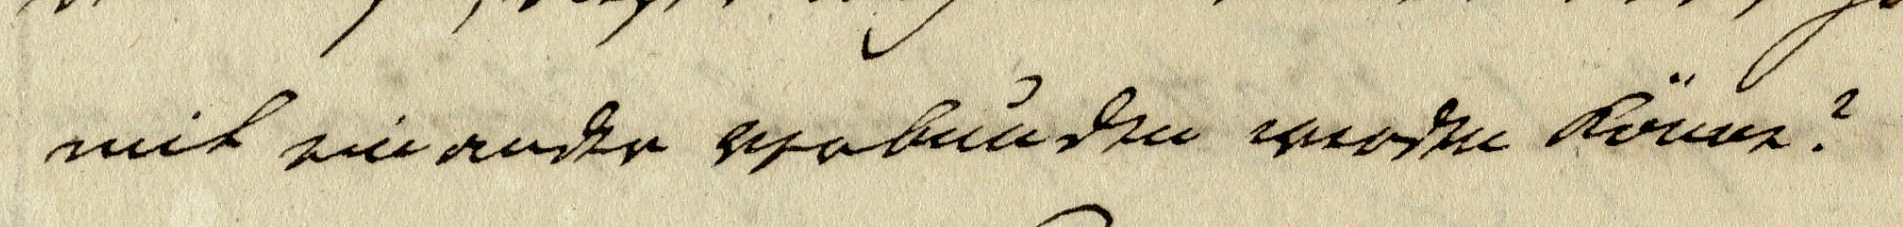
mit einander verbunden werden könne?
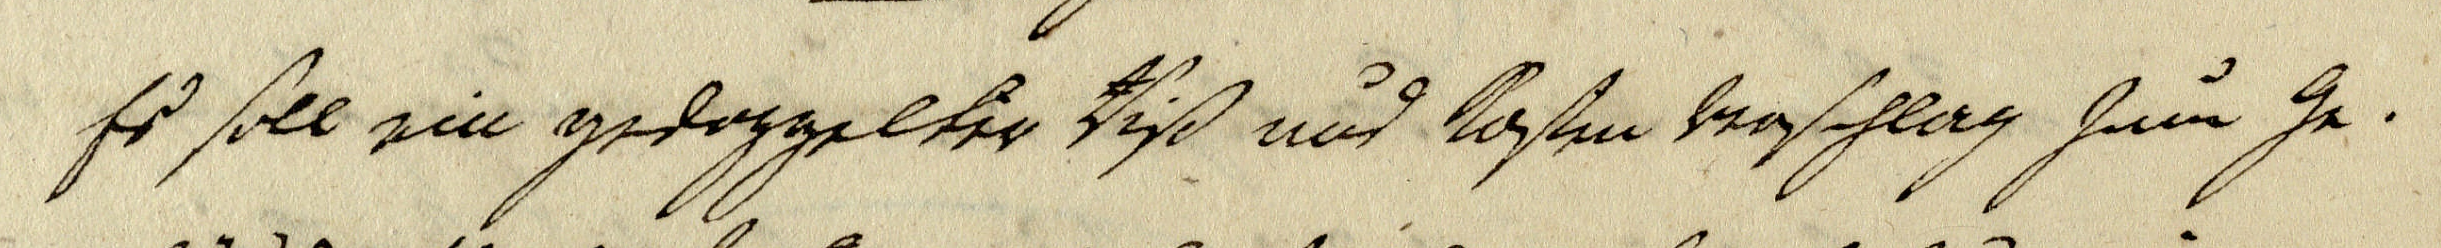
Es soll ein gedoppelter Riß und Kosten Verschlag zum Ge¬
